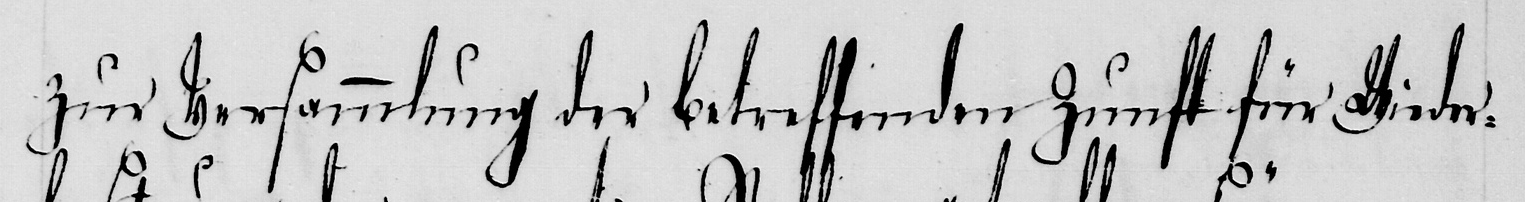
zur Versammlung der betreffenden Zunft für Wiede¬
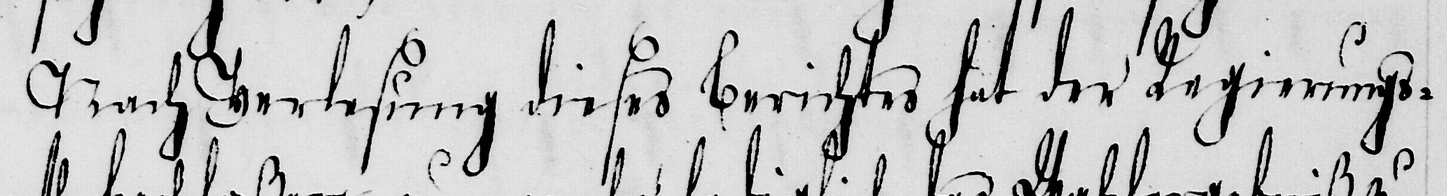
Nach Verlesung dieses Berichtes hat der Regierungs¬
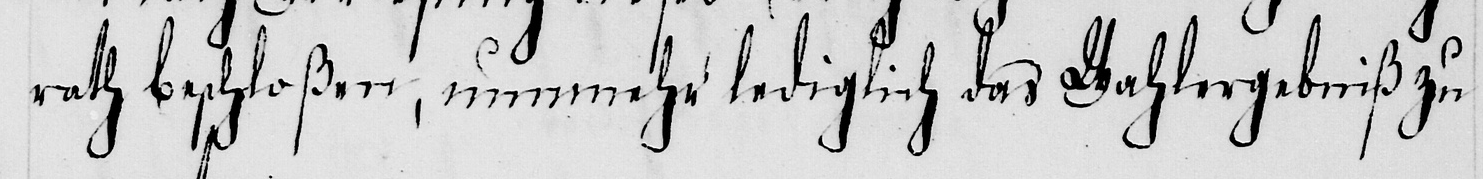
rath beschloßen, nunmehr lediglich das Wahlergebnis zu
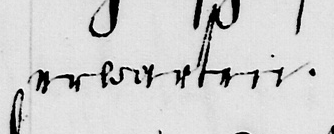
erwarten.
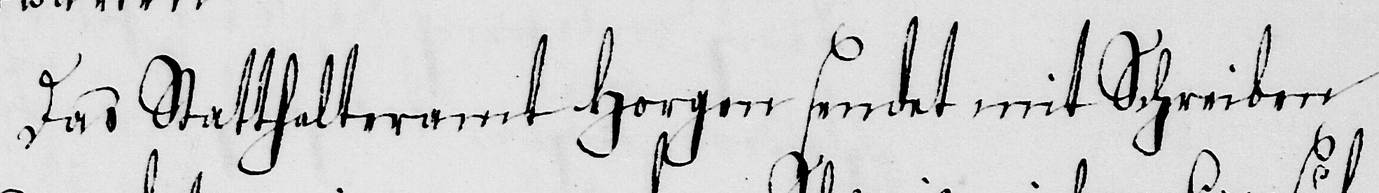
Das Statthalteramt Horgen sendet mit Schreiben
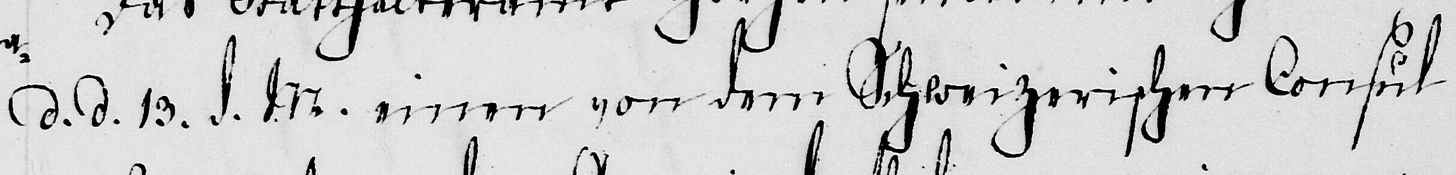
d. d. 13. d. M. einen von dem Schweizerischen Consul
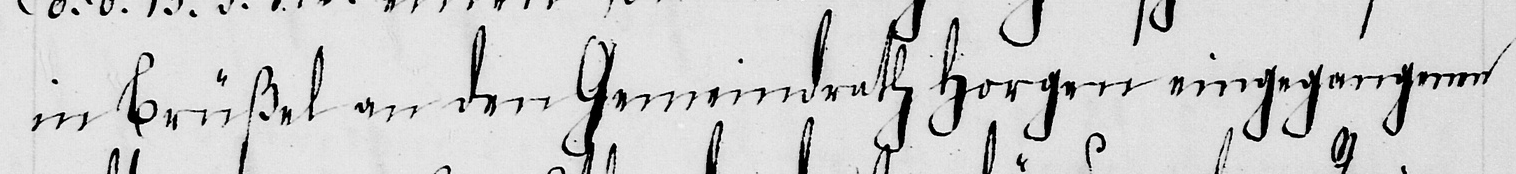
in Brüßel an den Gemeindrath Horgen eingegangenen
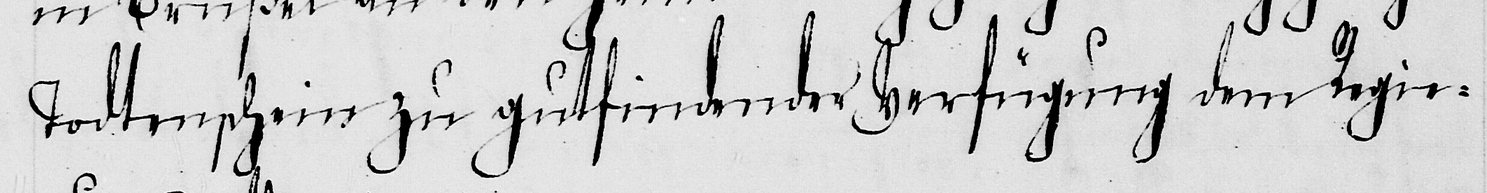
Todtenschein zu gutfindender Verfügung dem Regie¬
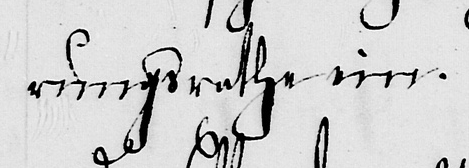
rungsrathe ein.
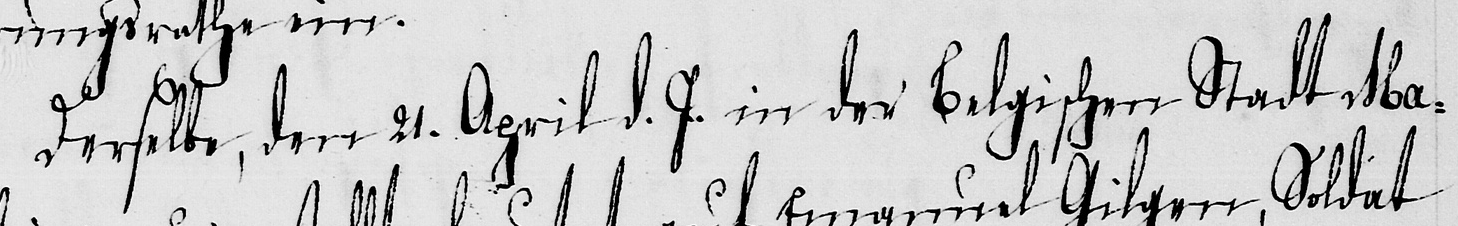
Derselbe den 21. April d. J. in der belgischen Stadt Ma¬
